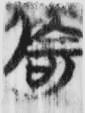倚
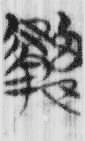執
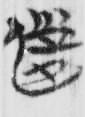○（僕）
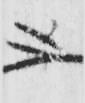之
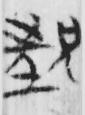○（兄）
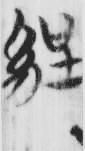○（盈）
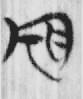陰
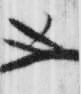之
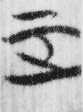正
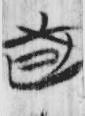或（又）
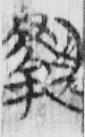執
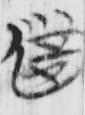○（僕）
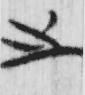之
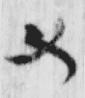父
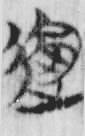逾
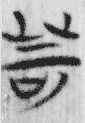苛
